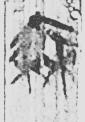秦
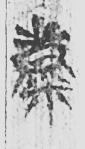康
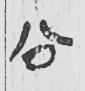公
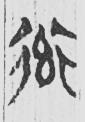率
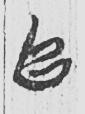𠂤
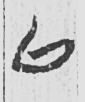㠯（以）
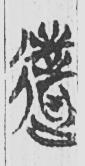{辶丵耳}
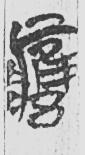{疒雍}
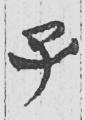子
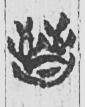晉
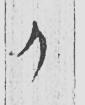人
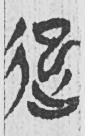起
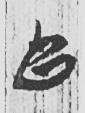𠂤
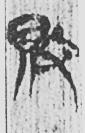敗
